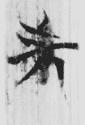先
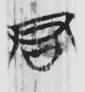君
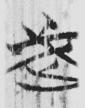武
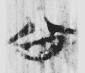公
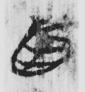西
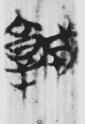{享成}
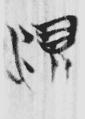洢
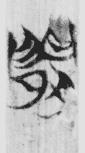{門外}
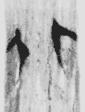北
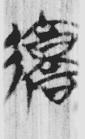{彳亯高}
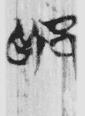{此阝}
